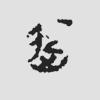起
